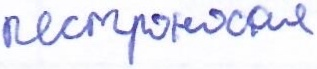пестроносая
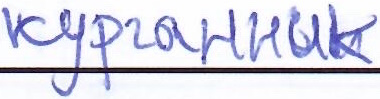курганник
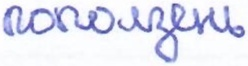поползень
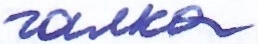галка
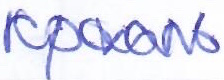крохаль
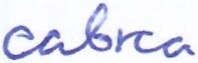савка
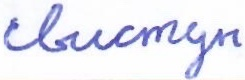свистун
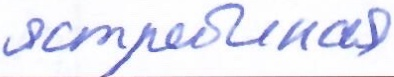ястребиная
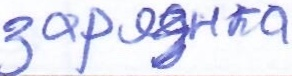зарянка
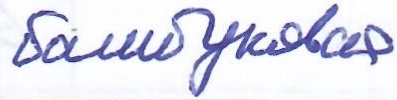бамбуковая
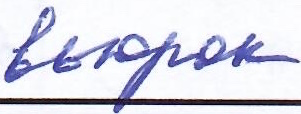вьюрок
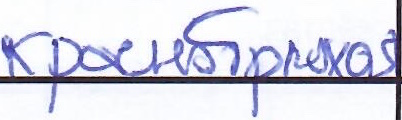краснобрюхая
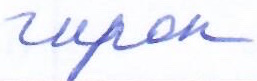чирок
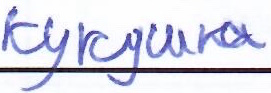кукушка
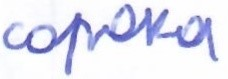сорока
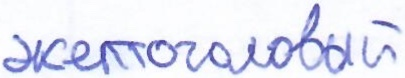желтоголовый
